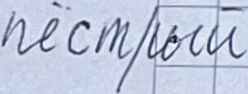пёстрый
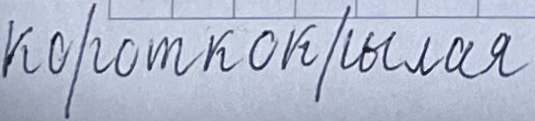короткокрылая
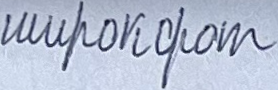широкорот
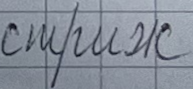стриж
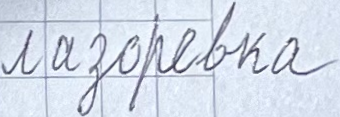лазоревка
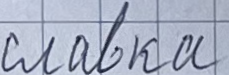славка
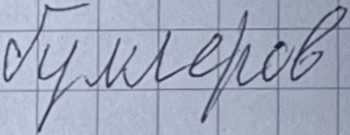буллеров
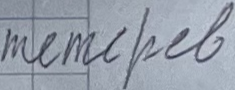тетерев
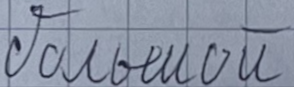большой
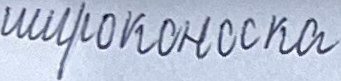широконоска
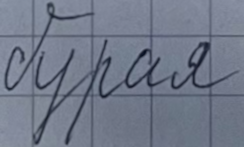бурая
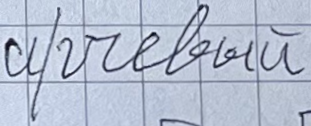арчевый
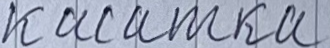касатка
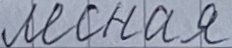лесная
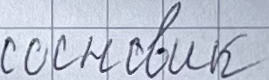сосновик
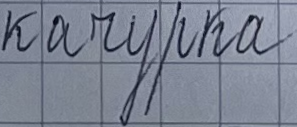качурка
